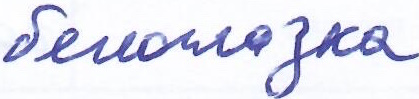белоглазка
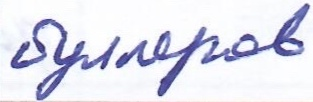буллеров
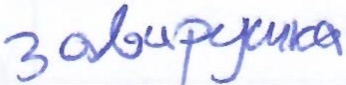завирушка
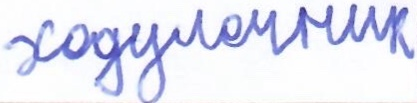ходулочник
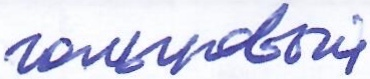гольцовый
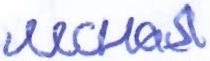лесная
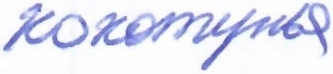хохотунья
